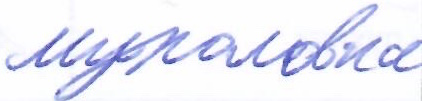мухоловка
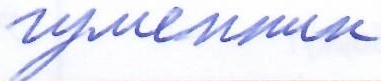гуменник
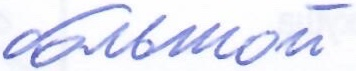большой
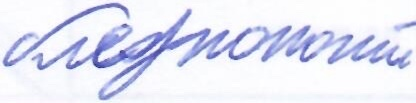бледноногий
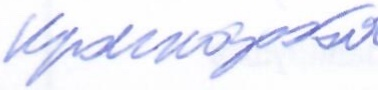краснозобая
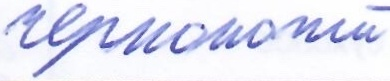черноногий
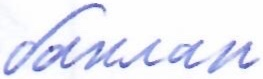баклан
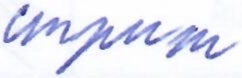стриж
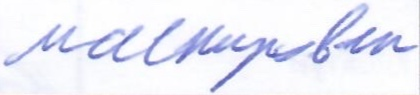маскировен
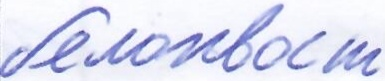белохвост
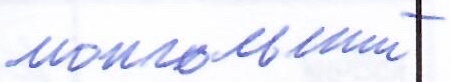монгольский
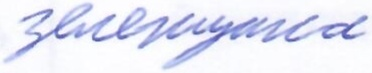зеленушка
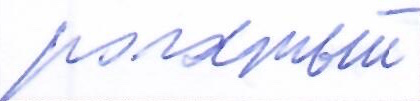рогатый
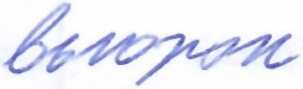вьюрок
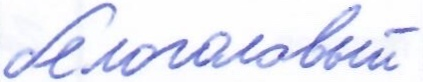белоголовый
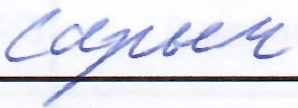сарыч
